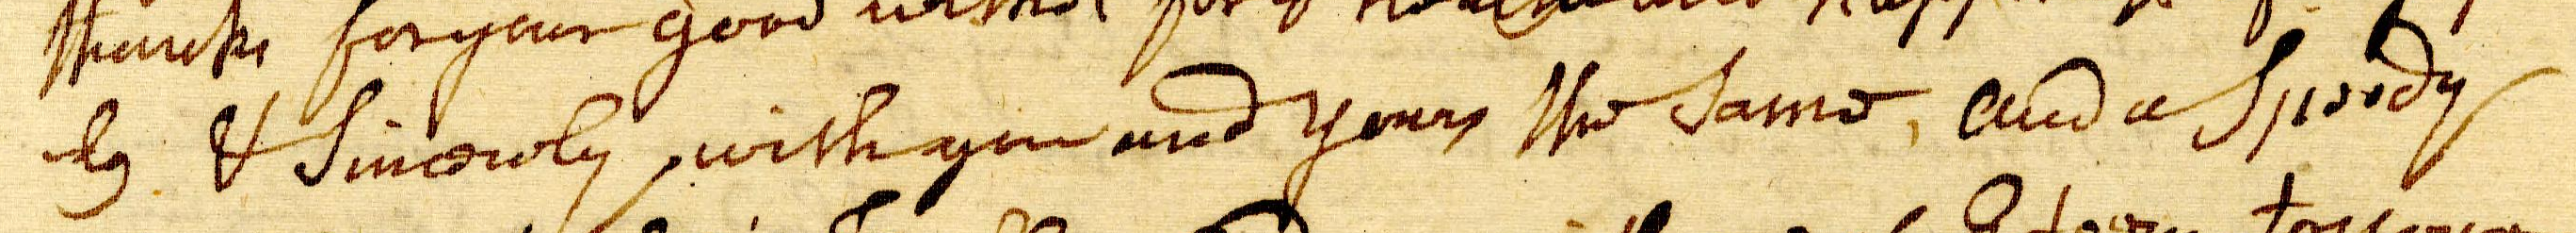ly & Sincerely wish you and Yours the same, And a Speedy
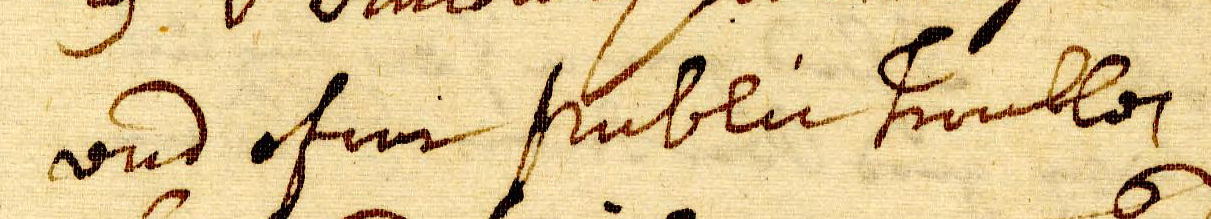end of our public Troubles
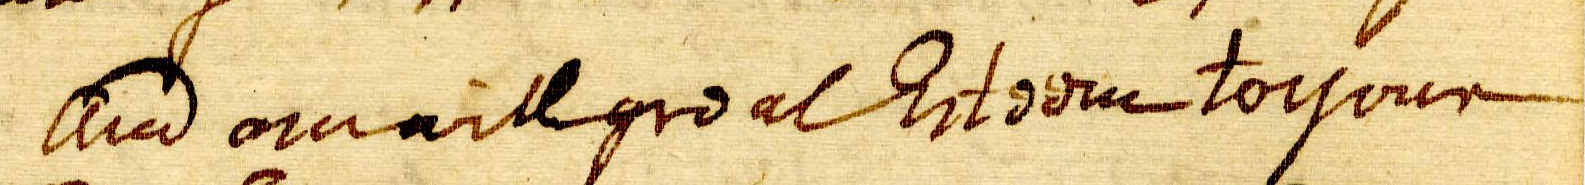And am with great Esteem to Your
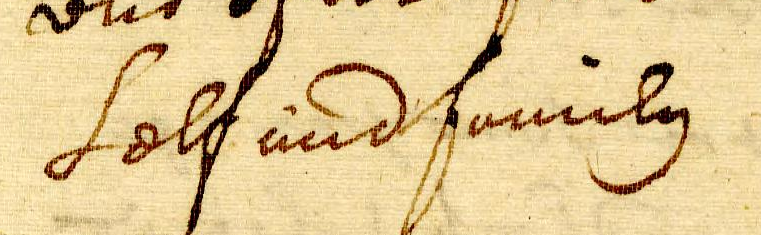Self and family
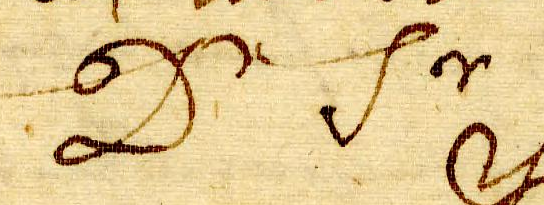D^r S^r
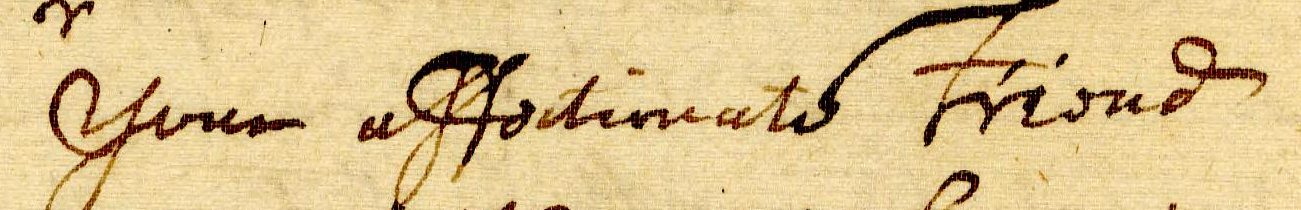Your affectionate Friend
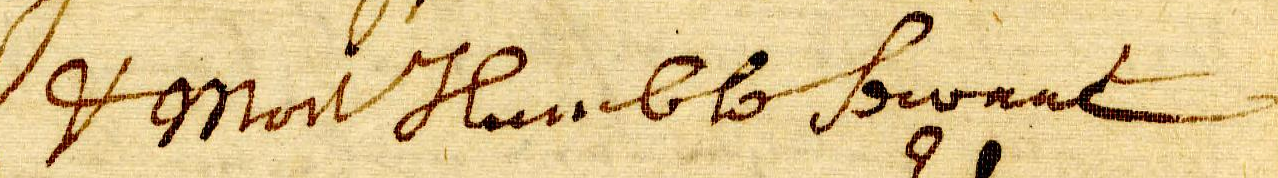& Most Humble Servant
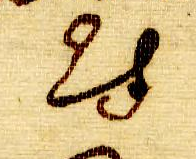ES
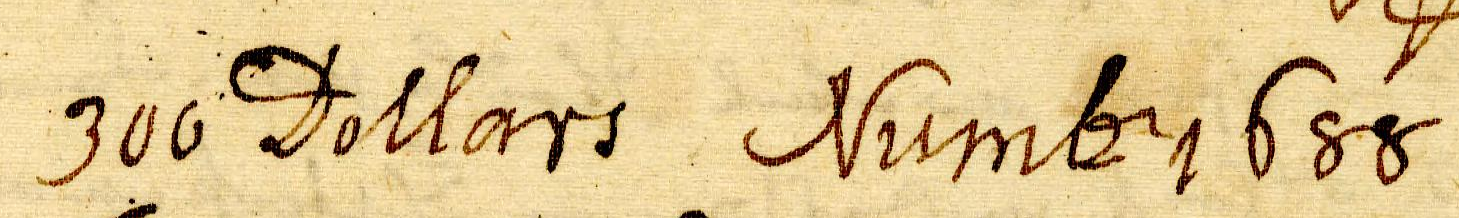300 Dollars Number 688
